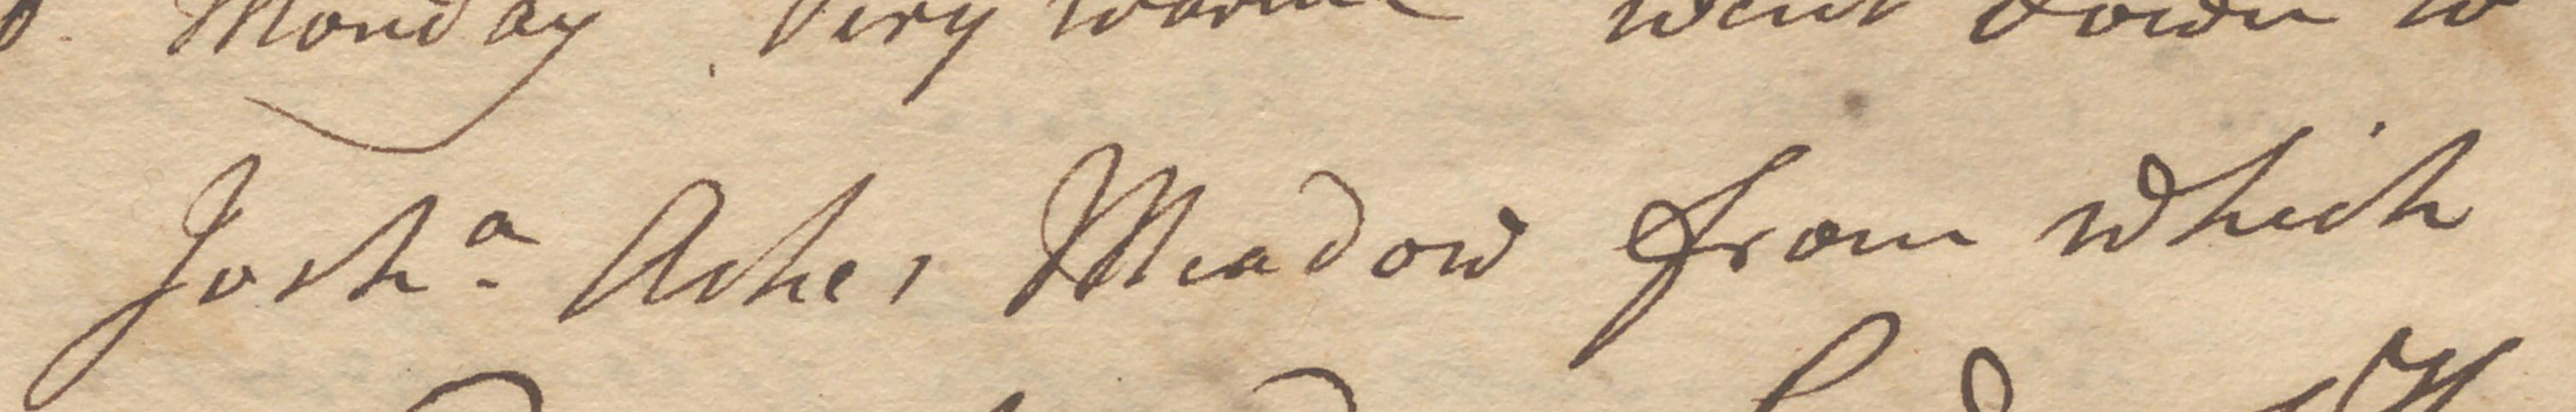Josh^a. Ashes Meadow from which
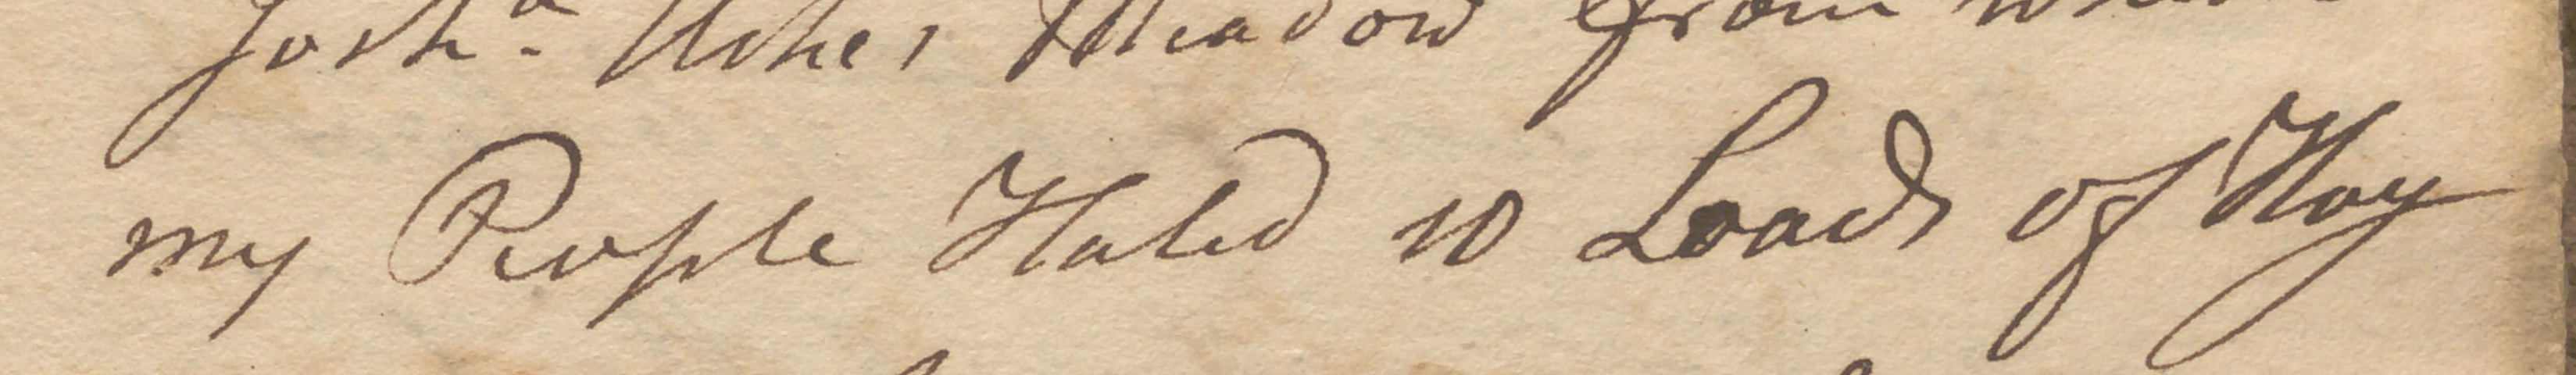my People Haled 10 Loads of Hay
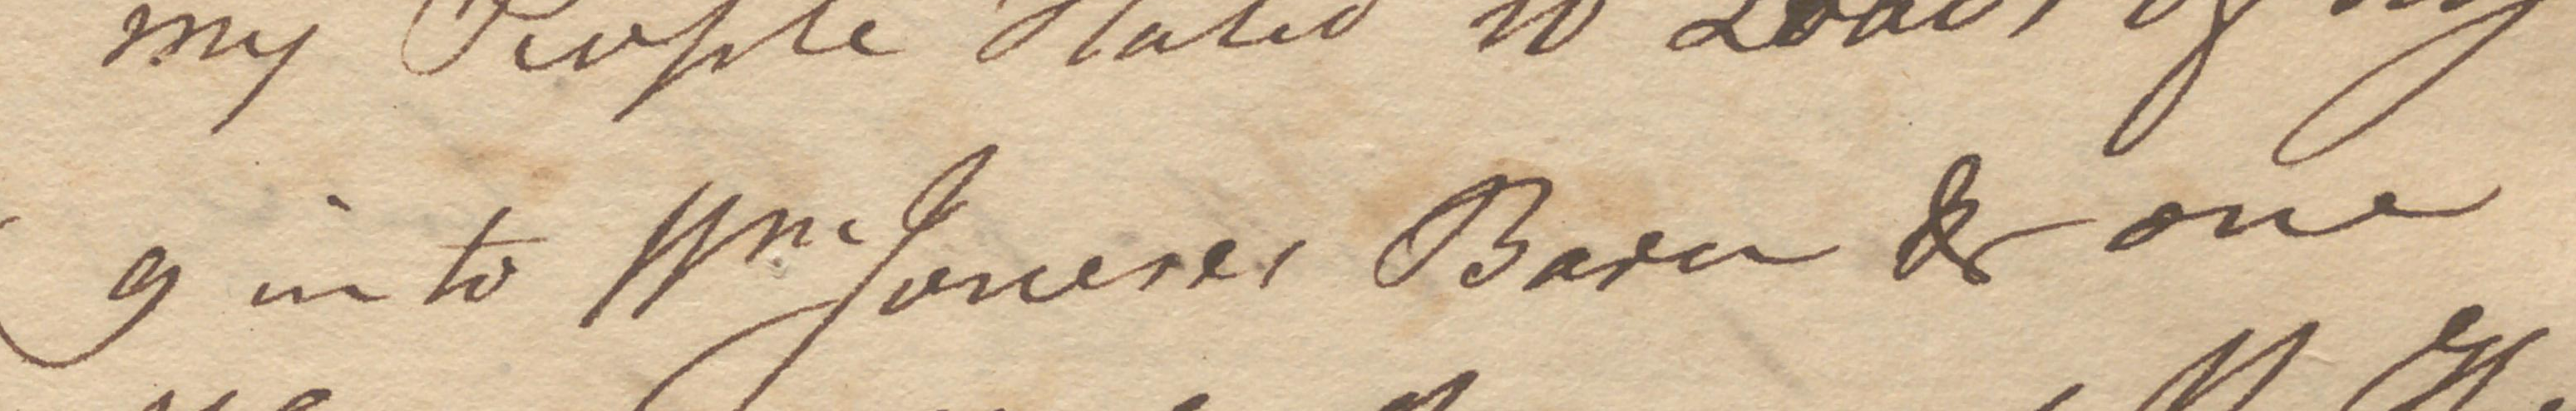9 into W^m Joneses Barn & one
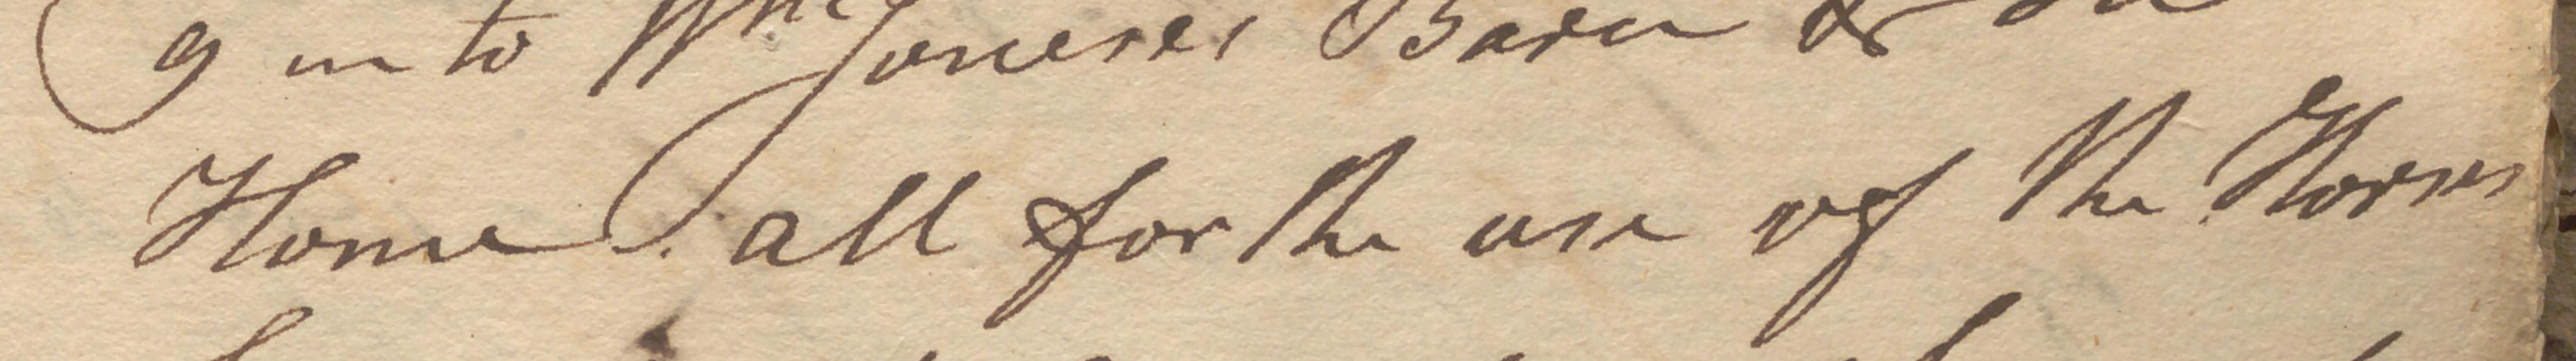Home all for the use of the Horses
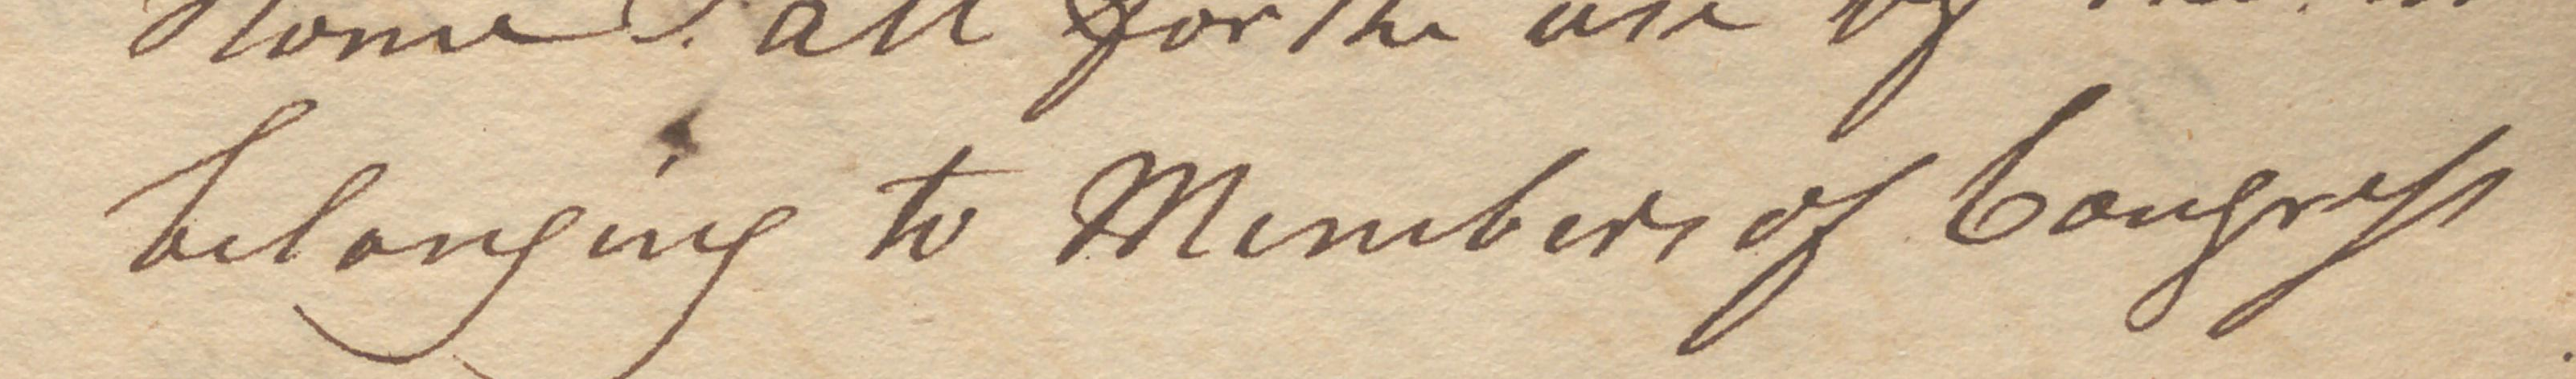belonging to Members of Congress
